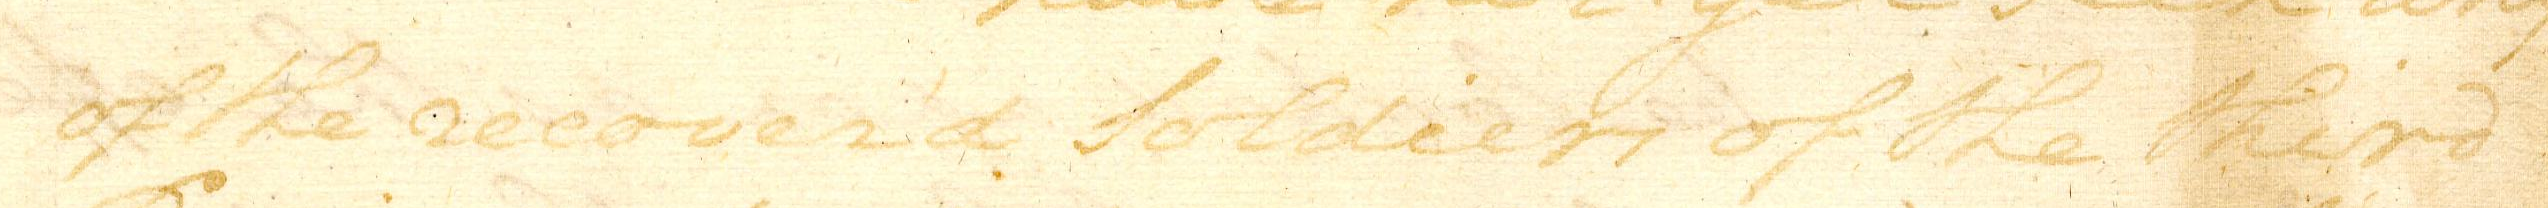of the recovered Soldiers of the third
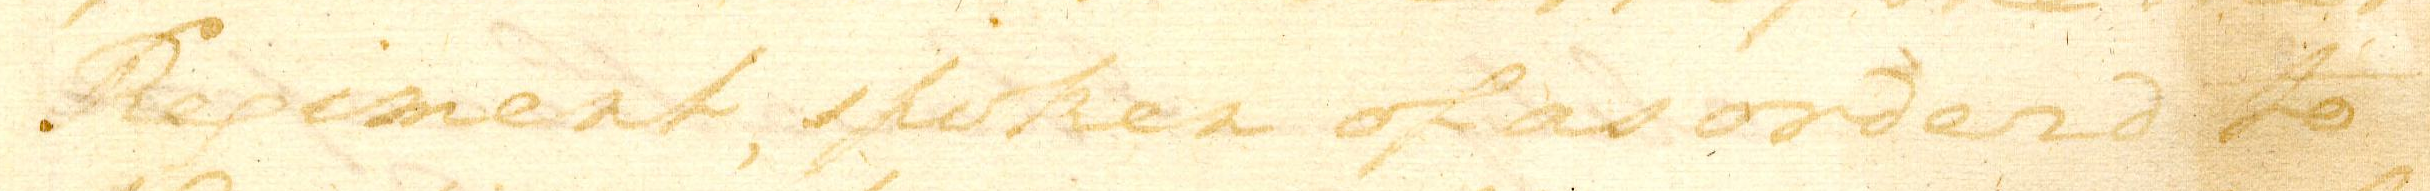Regiment, spoken of as ordered to
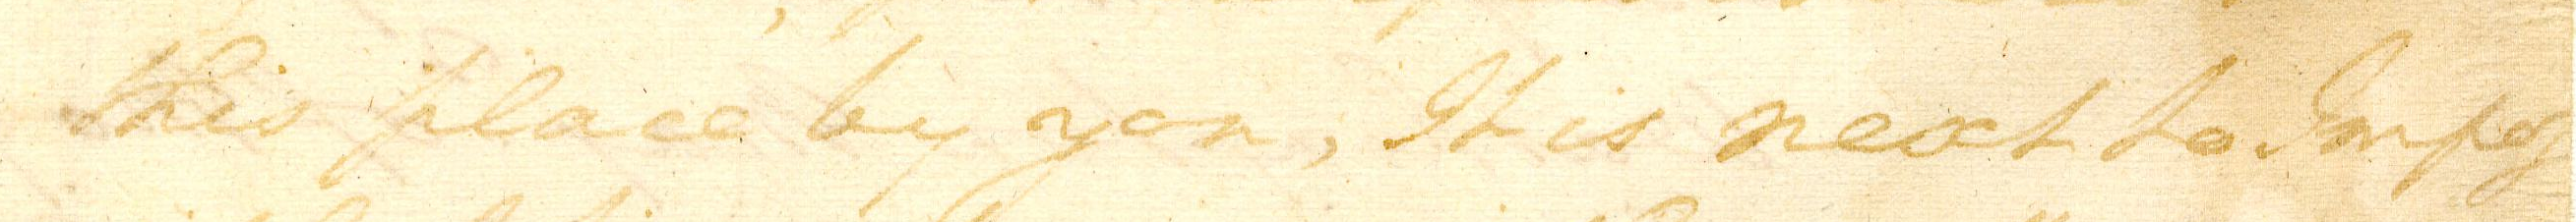this place by you, It is next to Impos
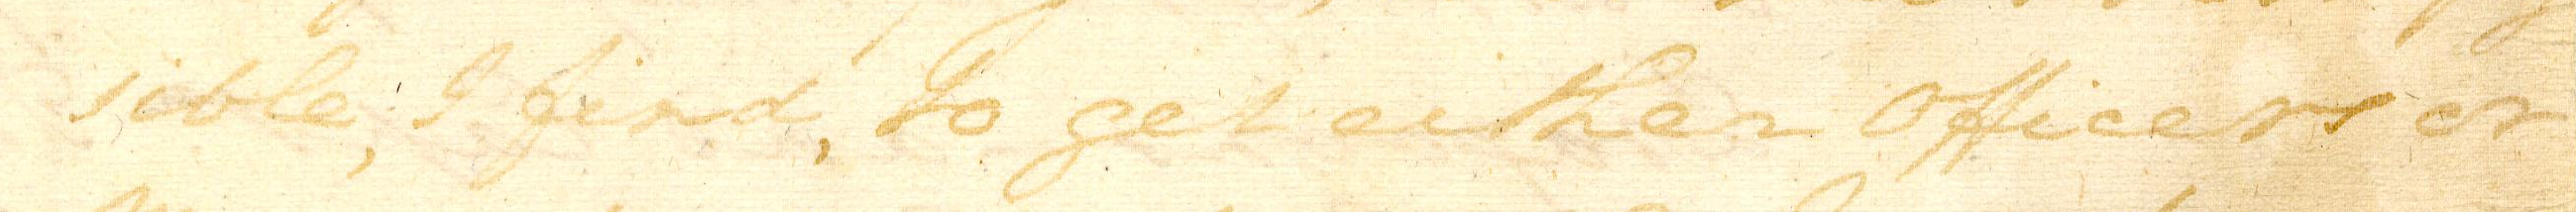sible, I find, to get either Officers or
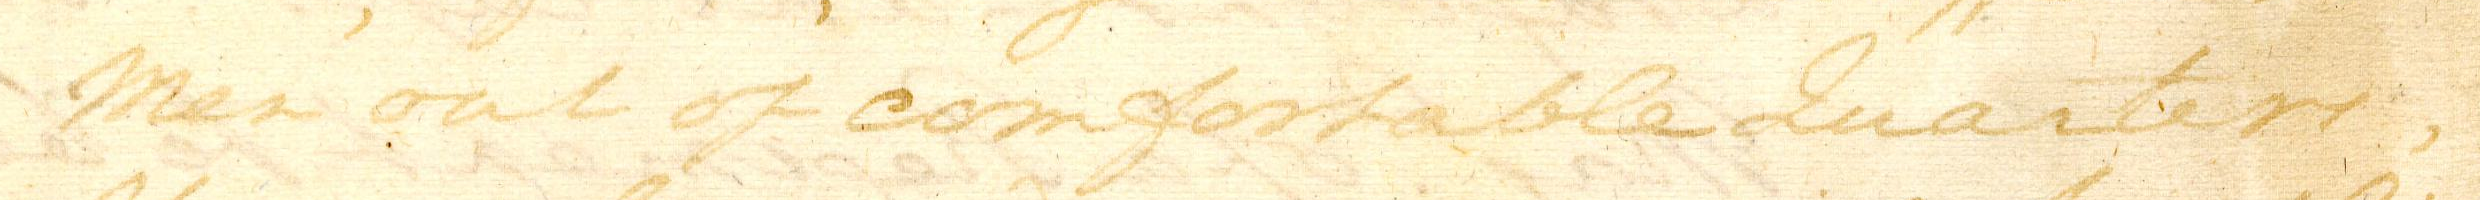Men out of comfortable Quarters,
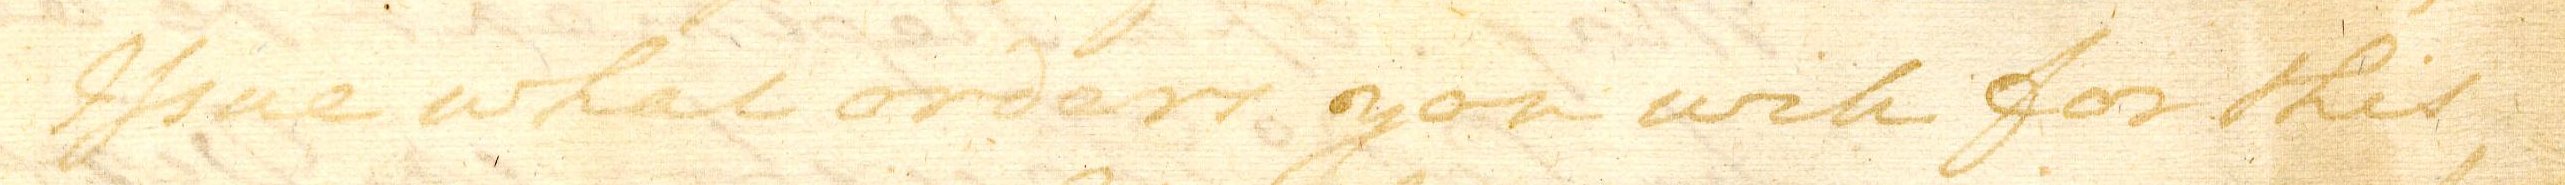Issue what orders you wish for this
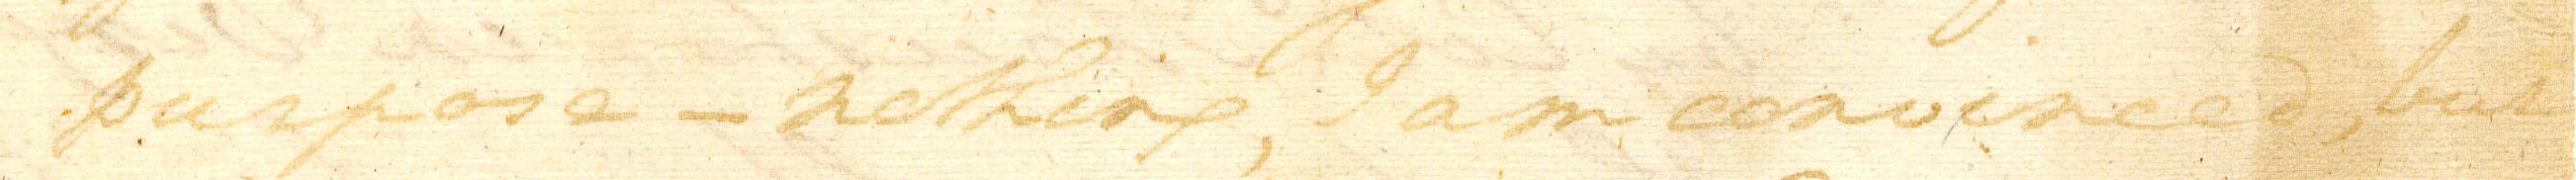purpose- nothing, I am convinced, but
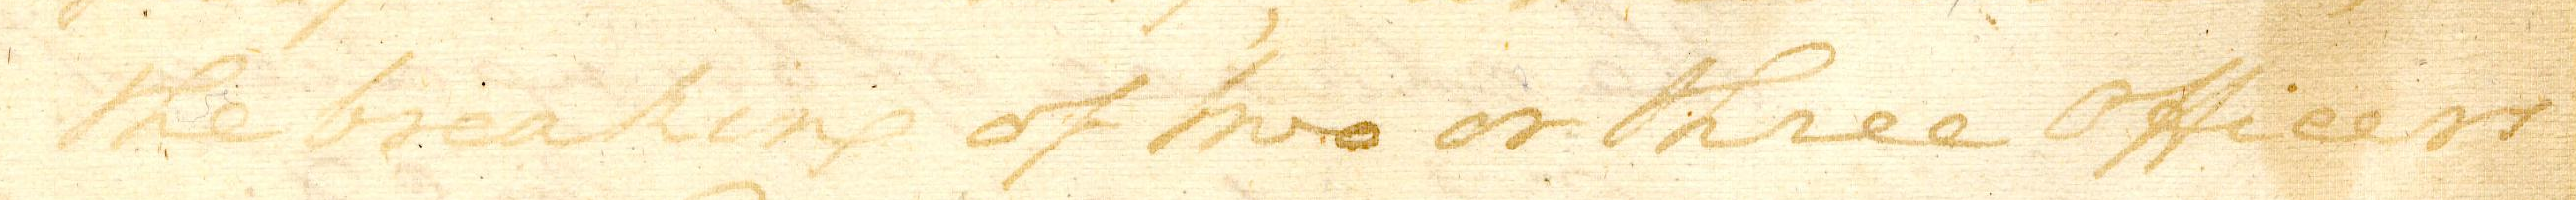the breaking of two or three Officers
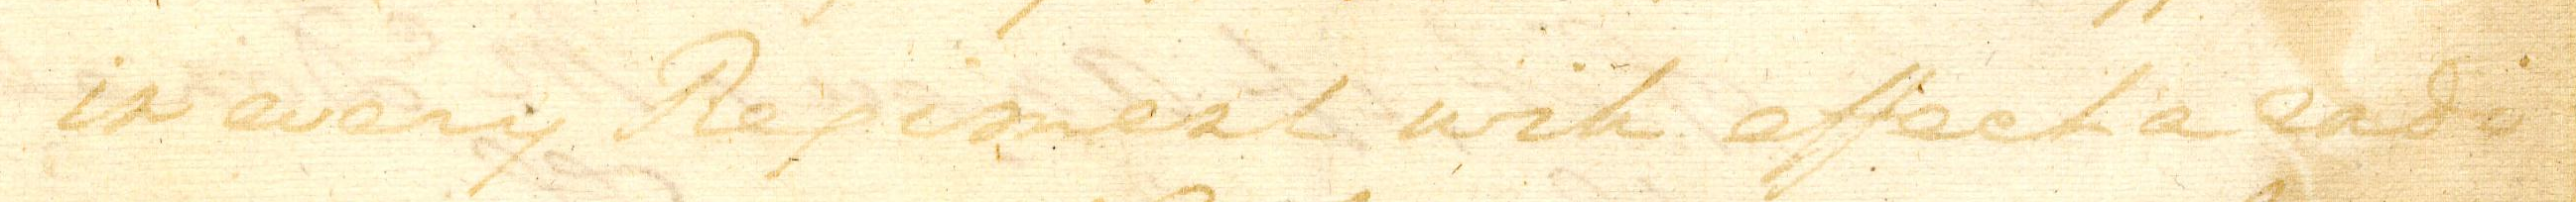in every Regiment will effect a radi
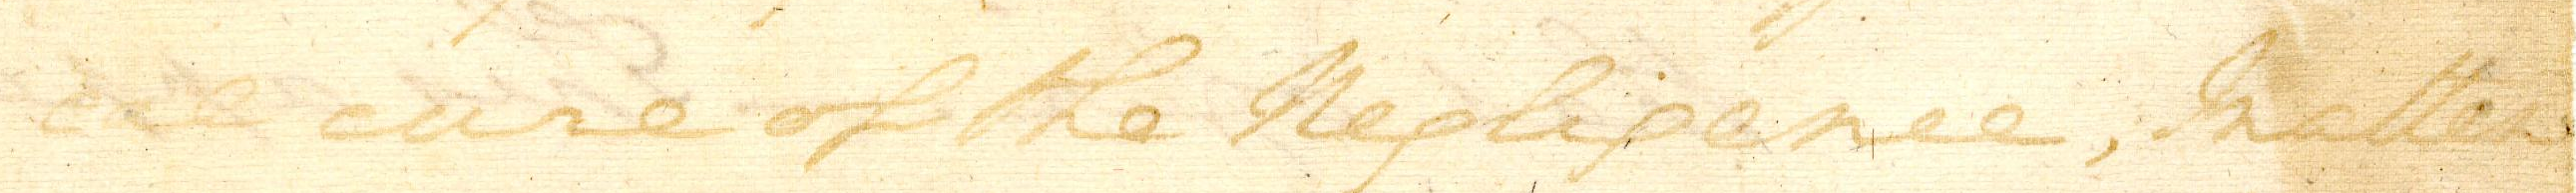cal cure of the Negligence, Inatten
